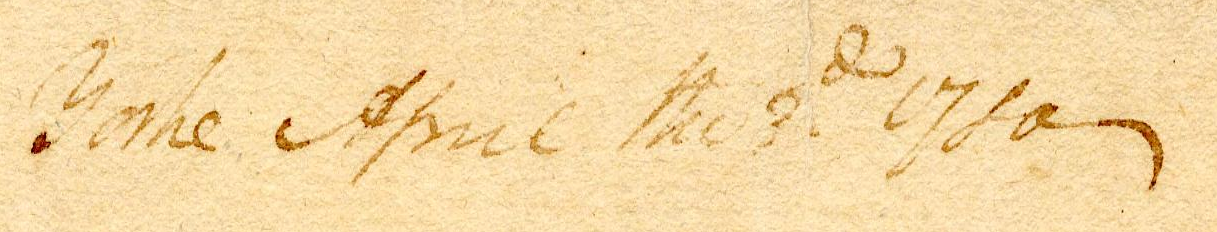Yorke April the 3^d. 1780
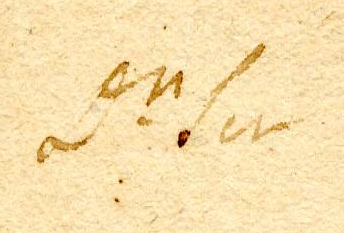D^r. Sir
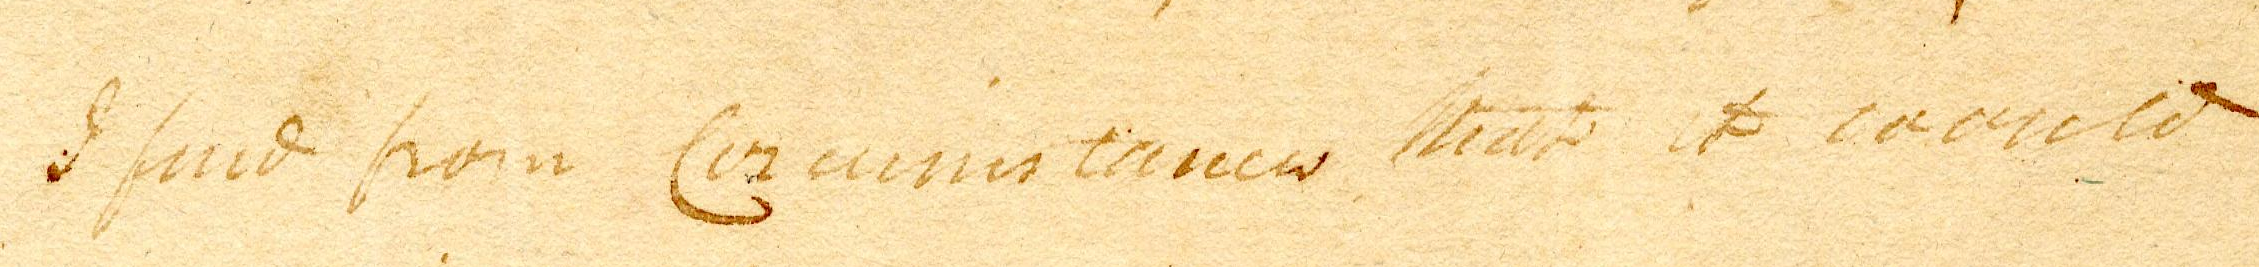I find from Circumstances that it would
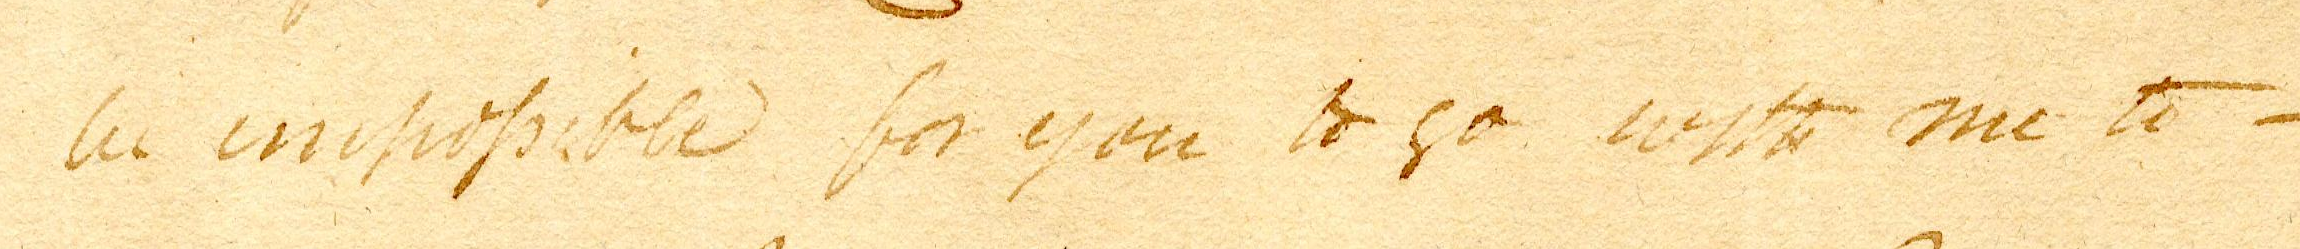be impossible for you to go with me to
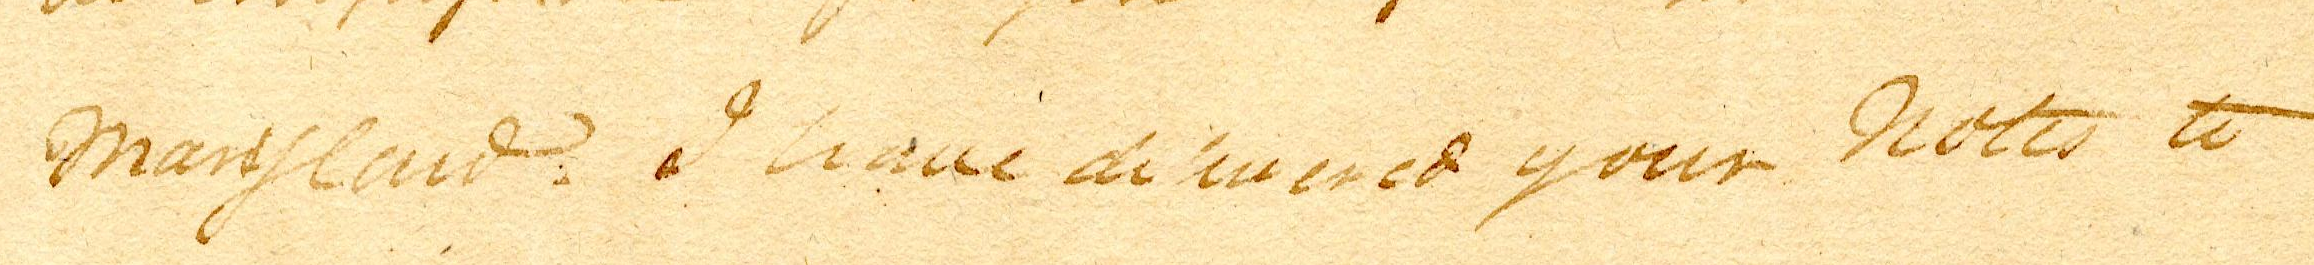Maryland. I have delivered your Notes to
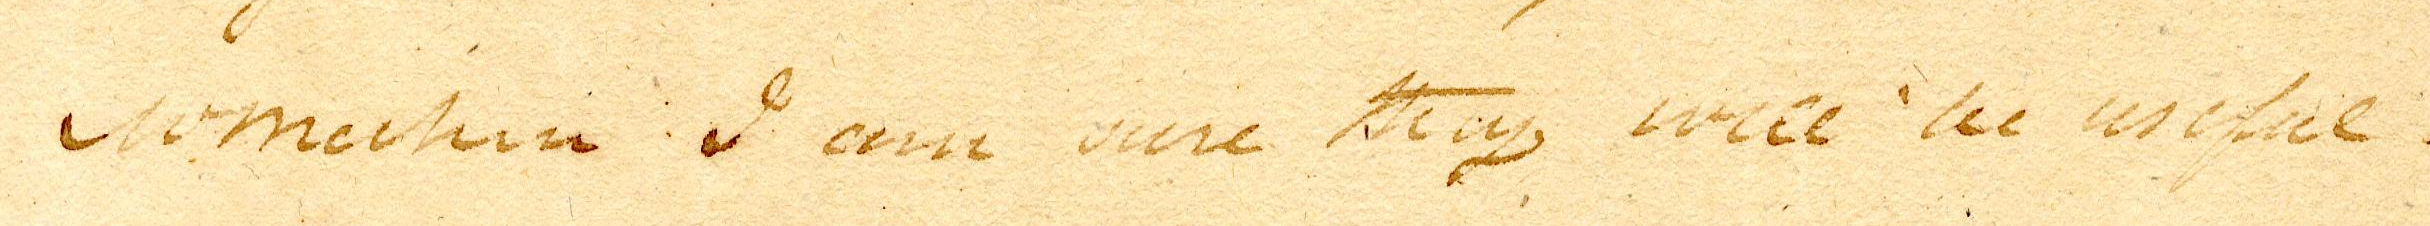M^r Micken I am sure they will be useful
